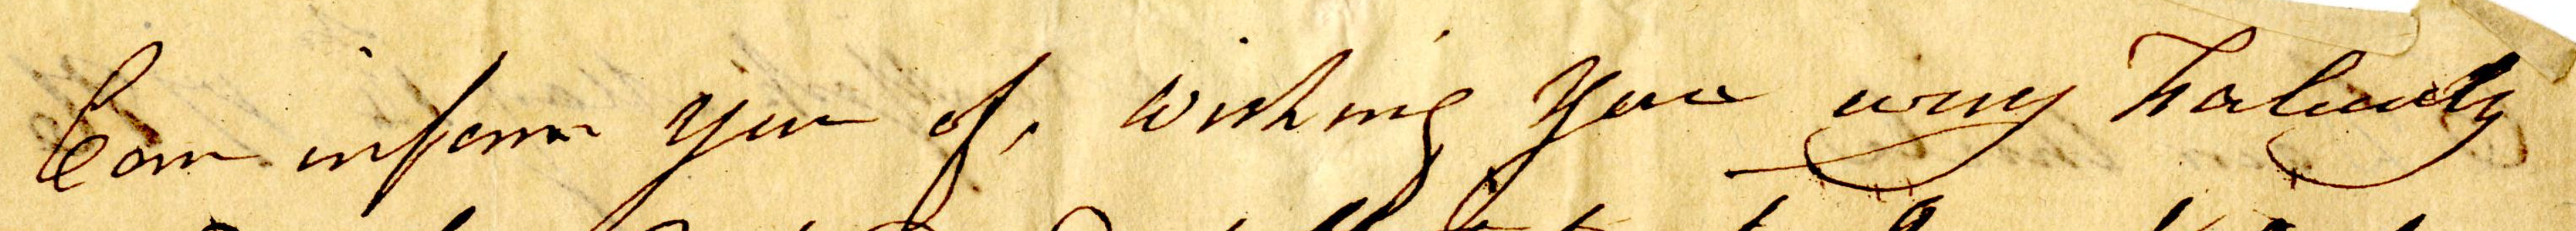can inform you of, wishing you every halovely
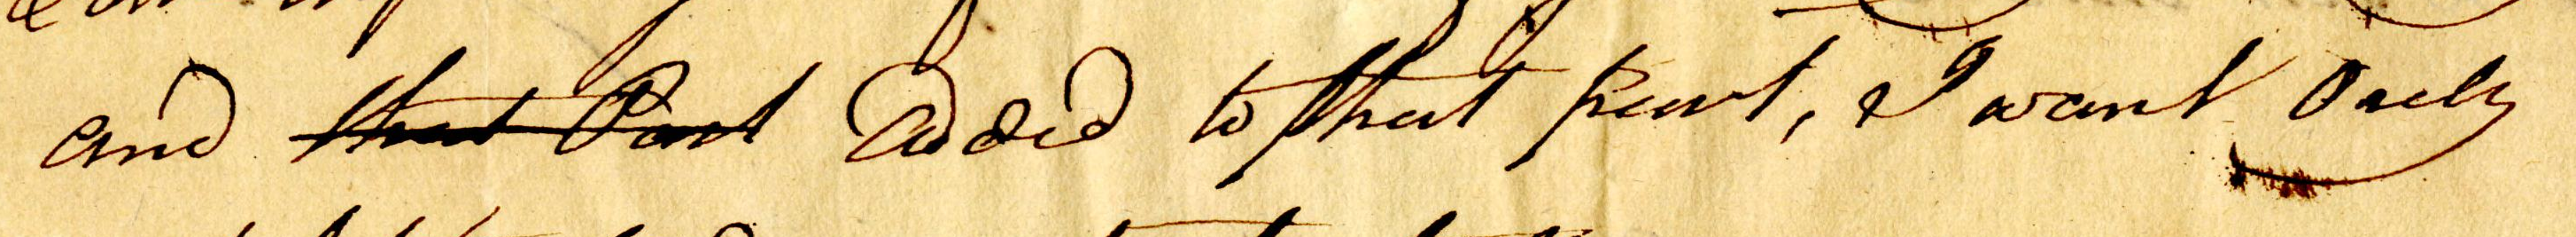and [that Part] Added to that part, I want only
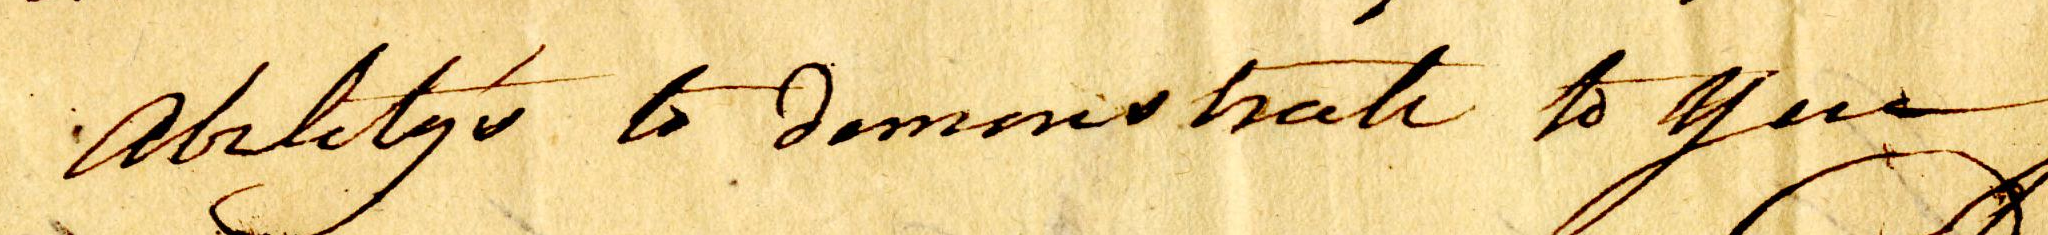Ability's to demonstrate to you
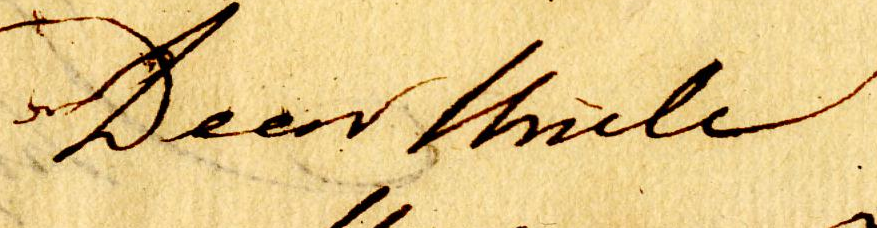Dear Uncle
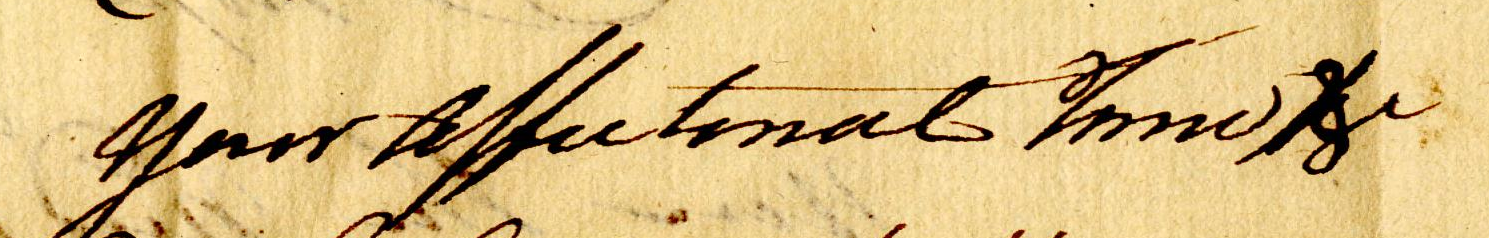our affectinat hme &c
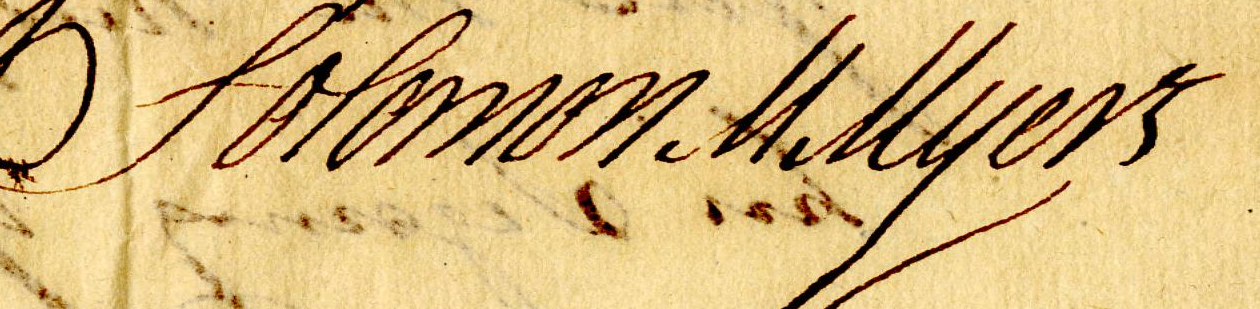Solomon M Myers
